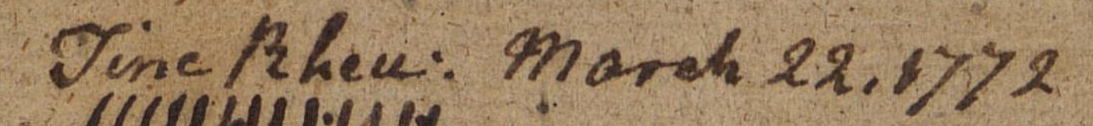Tine Rheu: March 22. 1772
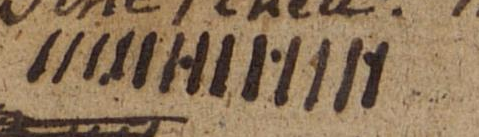IIIIIIIIIIIII
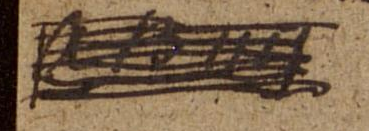[A B III]
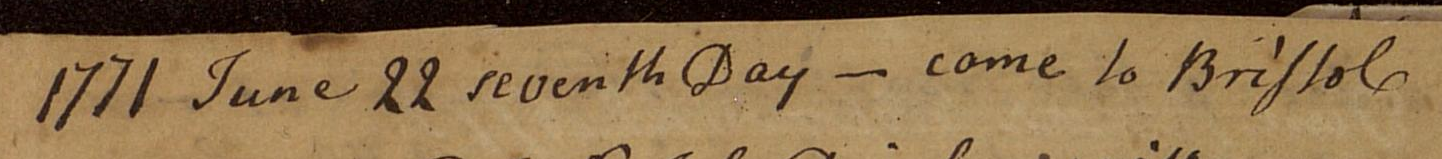1771 June 22 seventh Day- come to Bristol
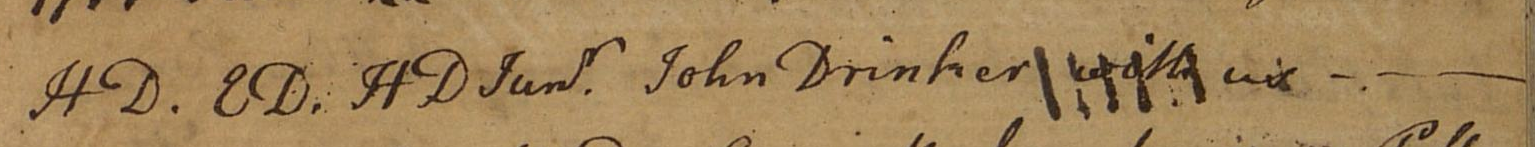H D. ED. HD Jun^r. John drinker with us-
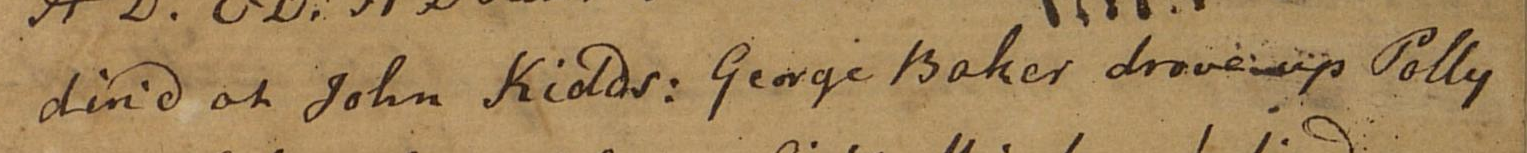din'd at John Kidds: George Baker drove up Polly
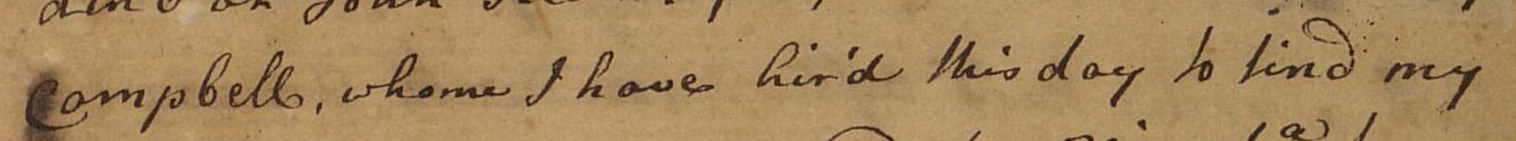Campbell, whome I have hir'd this day to find my
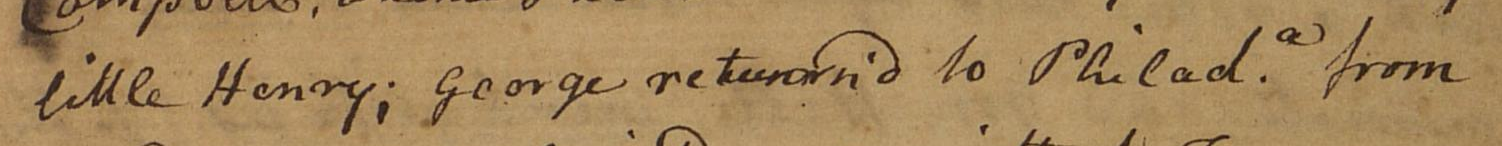little Henry; George returun'd to Philad^a. from
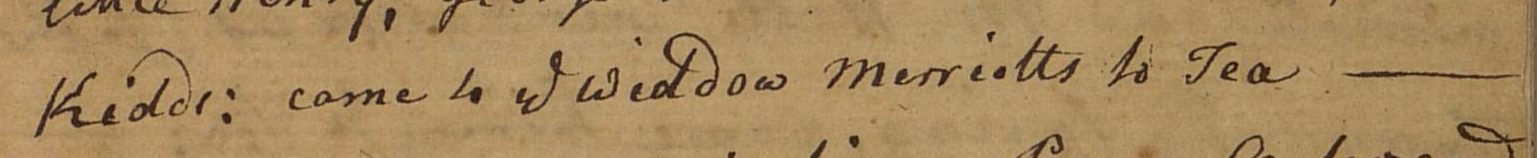Kidds: came to y^e Widdow Merriotts to Tea-
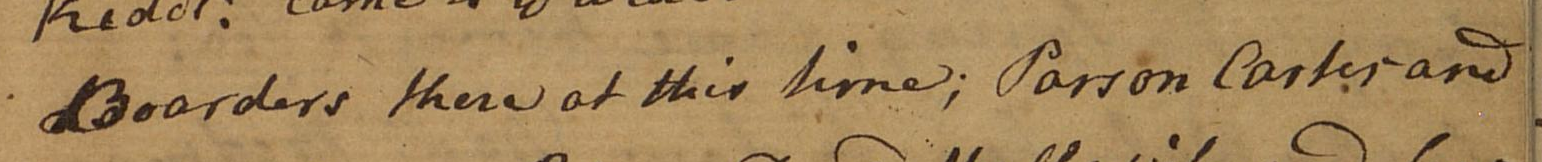Boarders there at this time; Parson Carter and
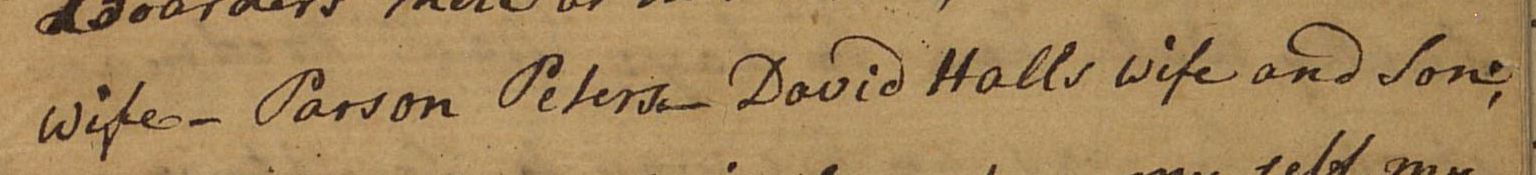Wife- Parson Peterson David Halls Wife and Son;
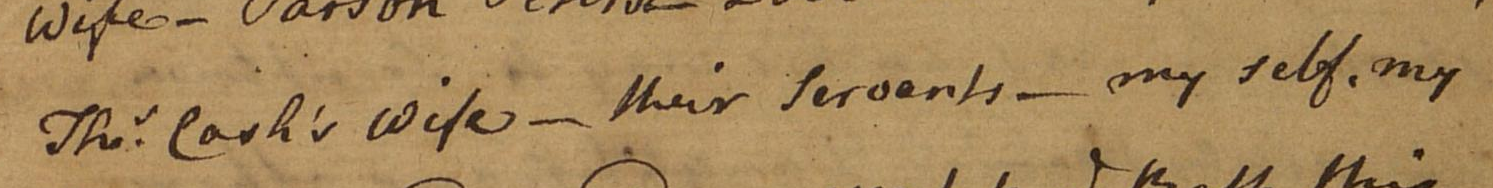Tho^s. Cash's Wife- their Servants- my self, my
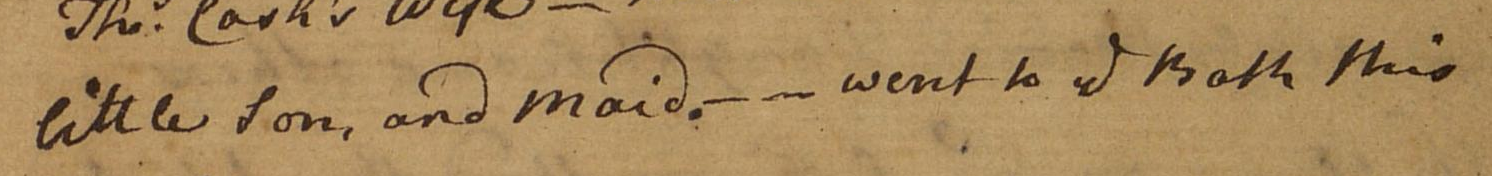little Son, and maid.- went to y^e Bath this
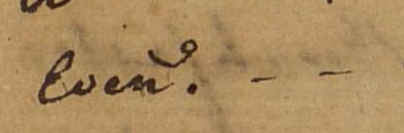Even^g.--
